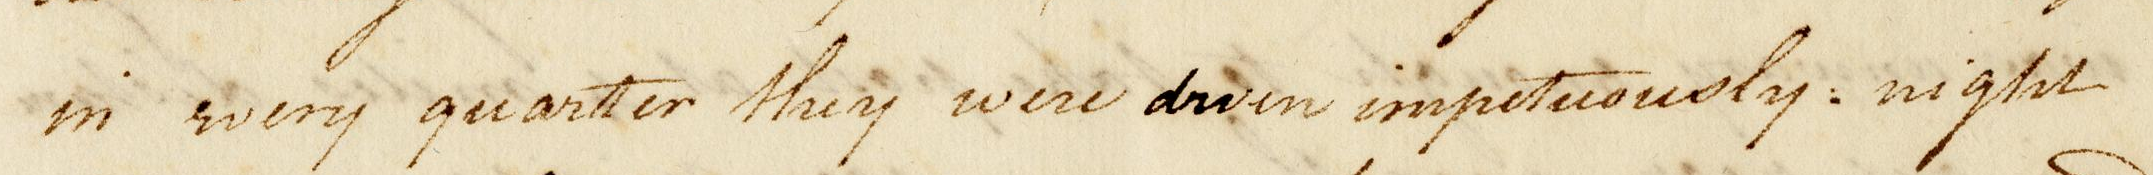in every quarter they were driven impetuously: night
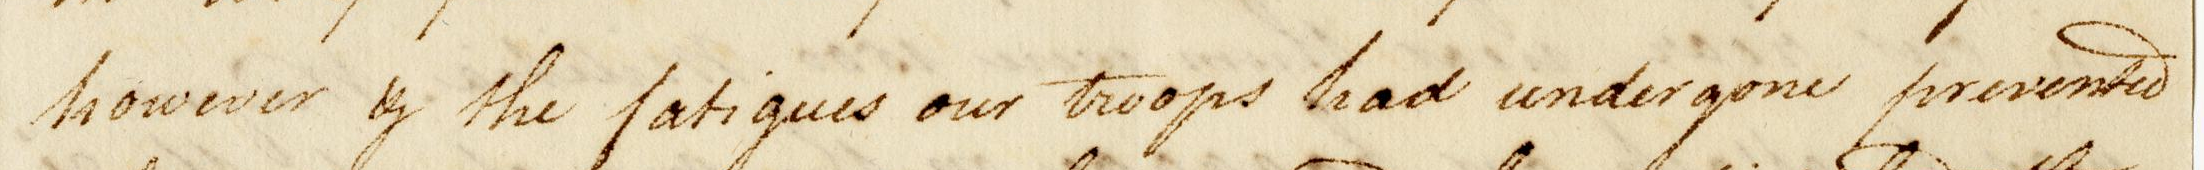however & the fatigues our troops had undergone prevented
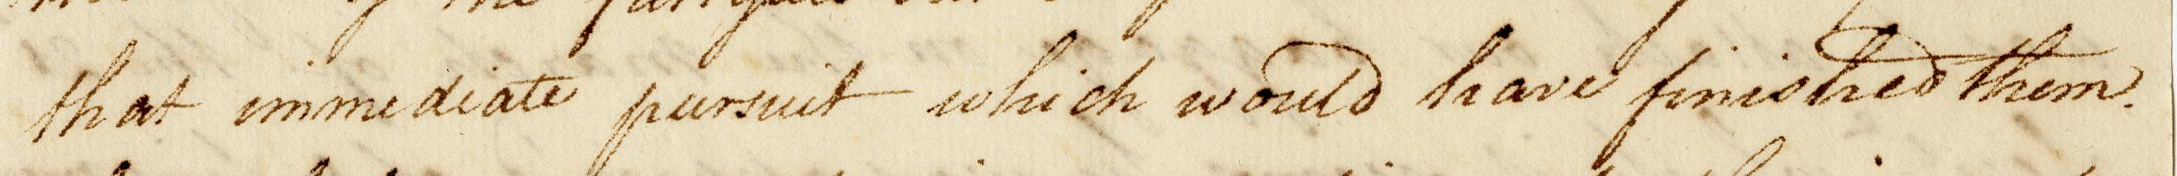that immediate pursuit which would have finished them.
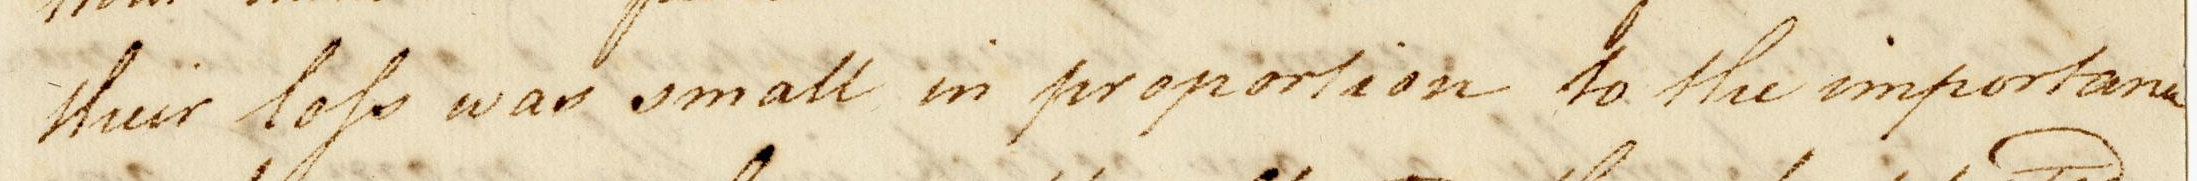their loss was small in proportion to the importance
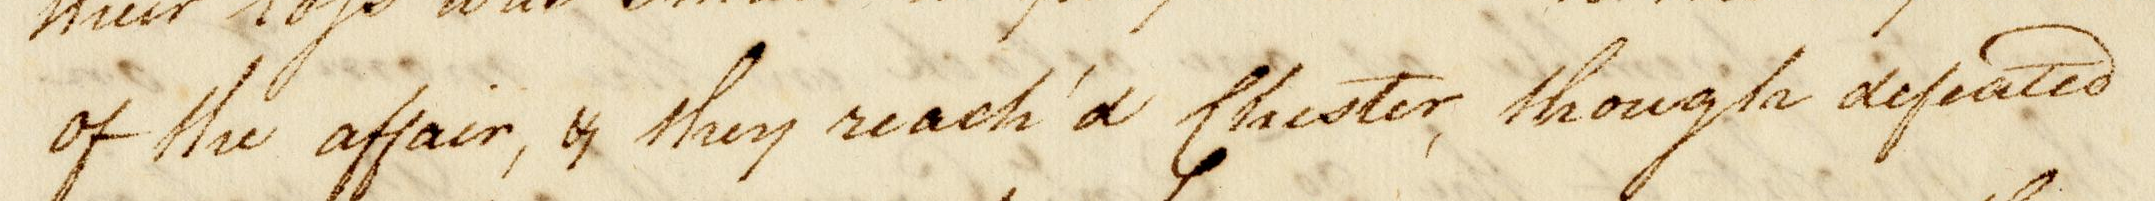of the affair, & they reach'd Chester though defeated
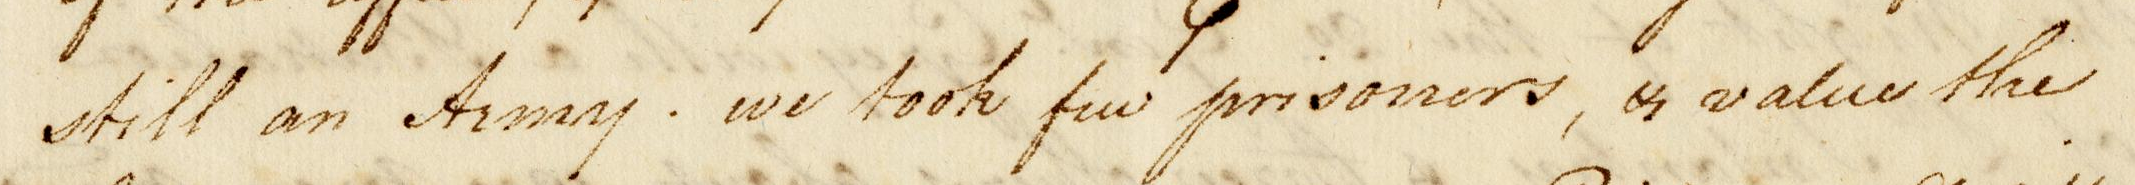still an Army. we took few prisoners, & value the
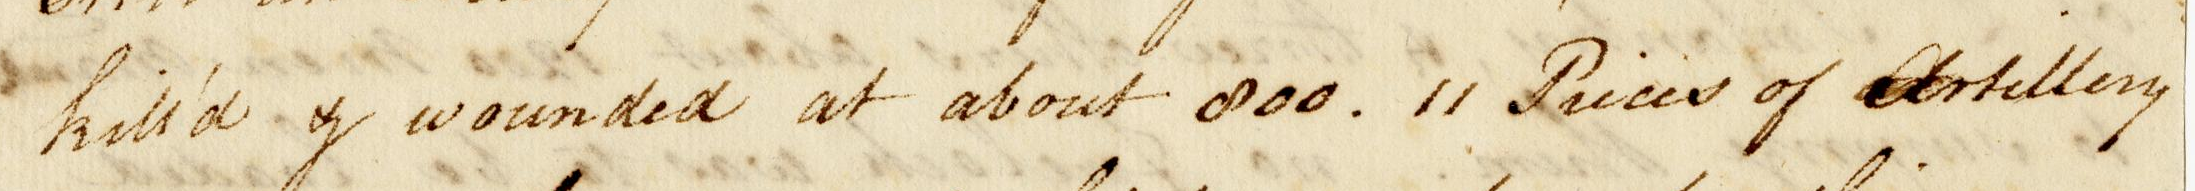kill'd & wounded at about 800. 11 Pieces of Artillery
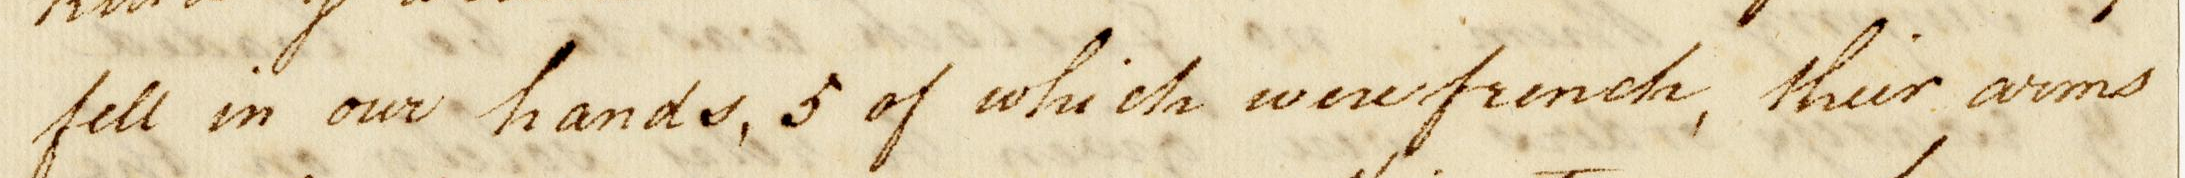fell in our hands, 5 of which were french, their arms
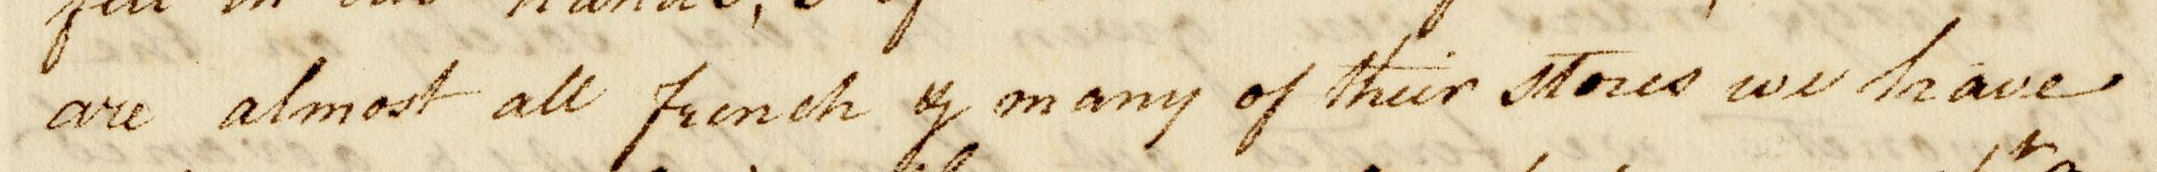are almost all french & many of their stores we have
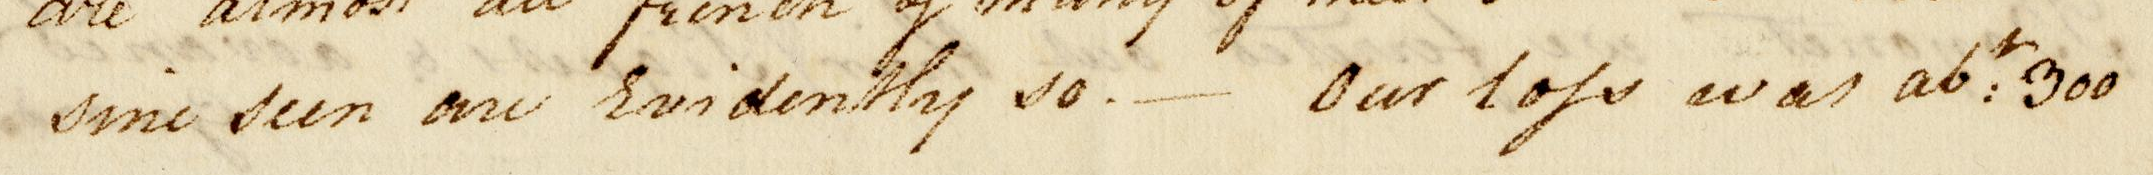since seen are Evidently so.- Our loss was ab^t: 300
